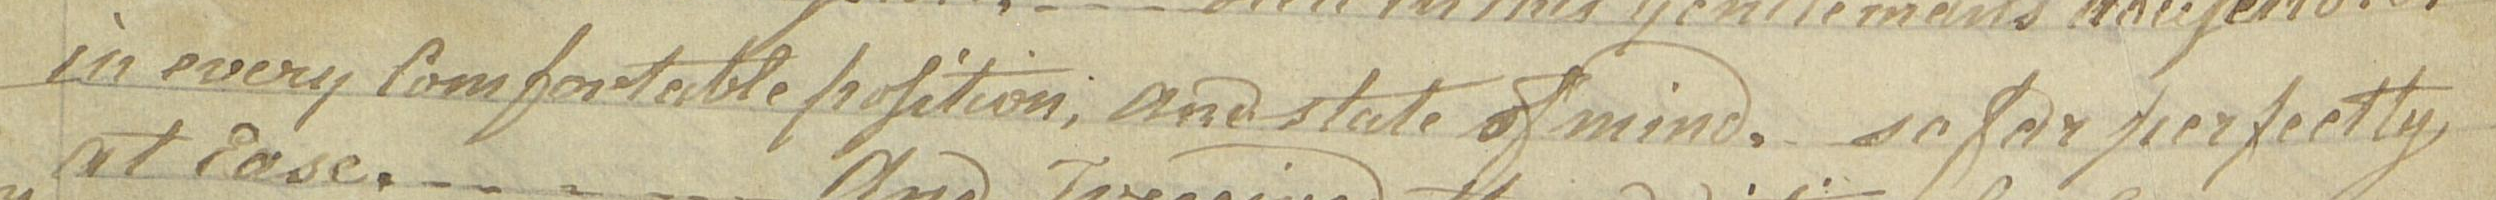in every Comfortable position; and state of mind. so far perfectly
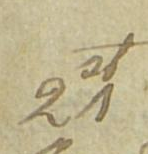21^st
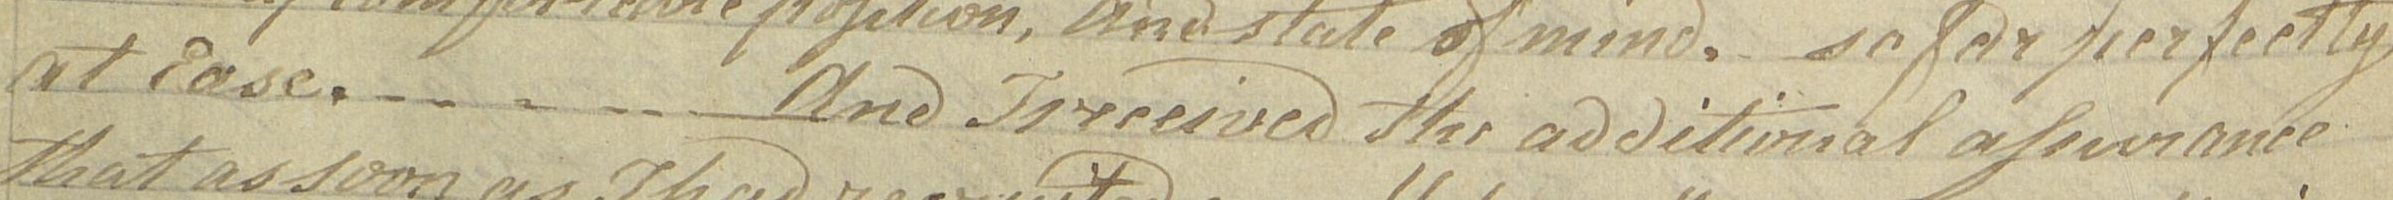at Ease. And I received the additional assurance
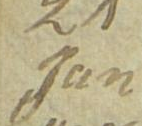Jan^y
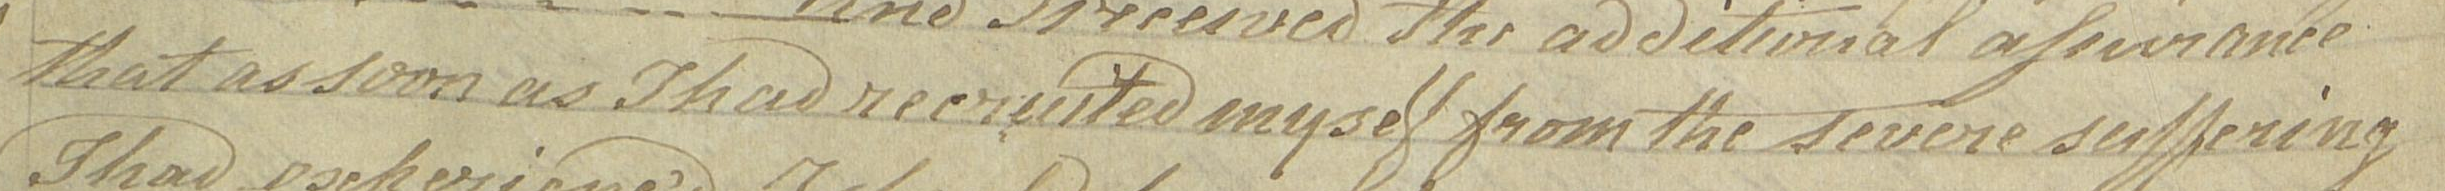that as soon as I had recruited myself from the severe suffering
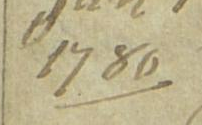1780
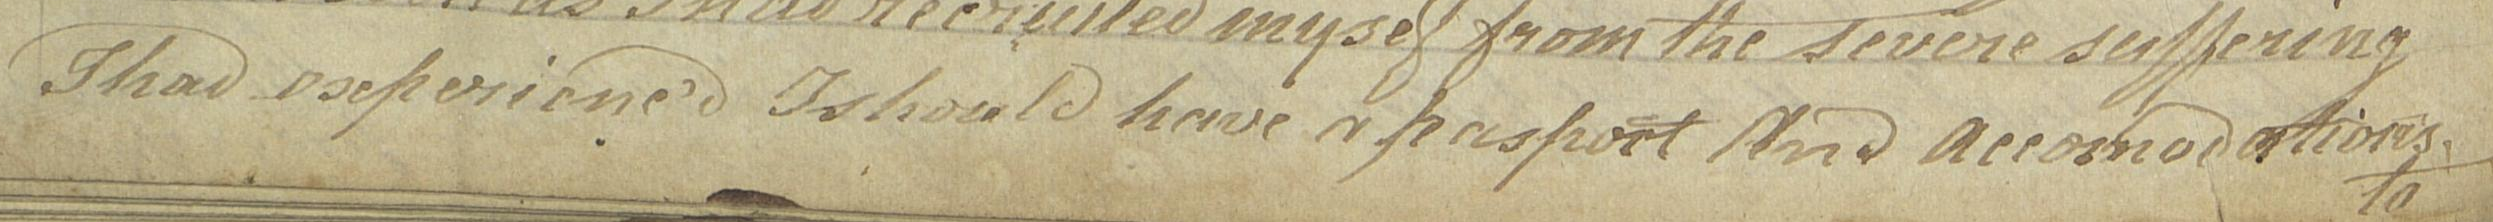I had experienc'd I should have a pasport and accomodations,
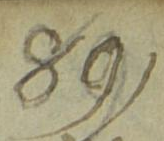89
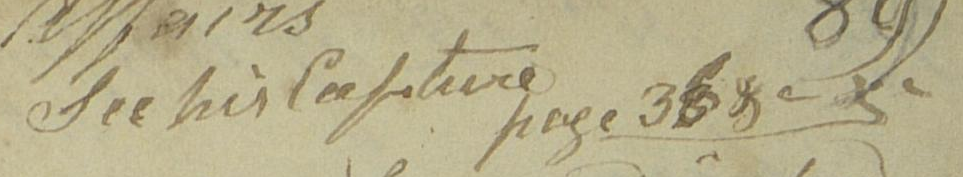See his Capture page 38 &^c &^c
